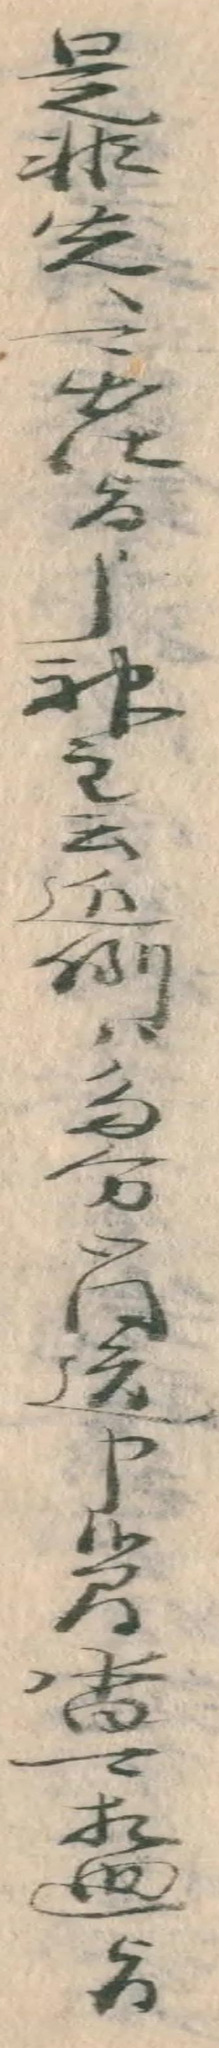是非先へ可出仕旨申神主云近例ハ多分御同道申候間沓可相廻旨
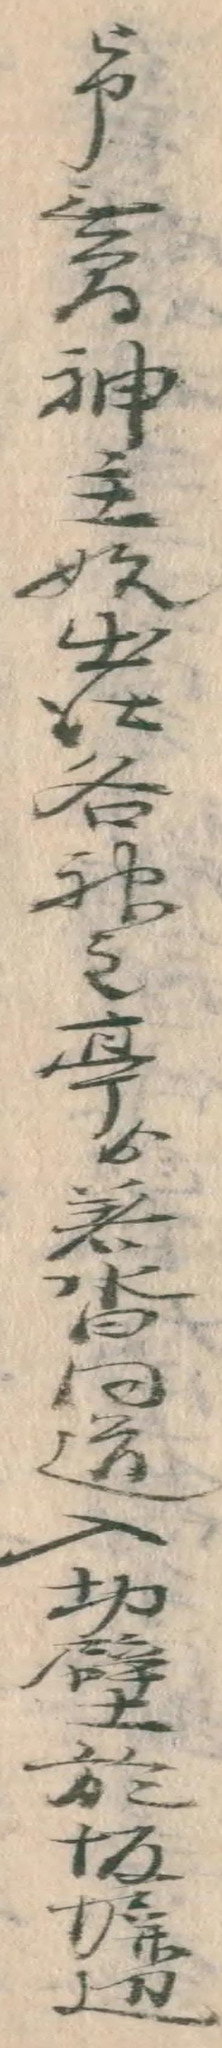被申無間神主始出仕各神主亭ゟ着沓同道入切壁於板塀辺
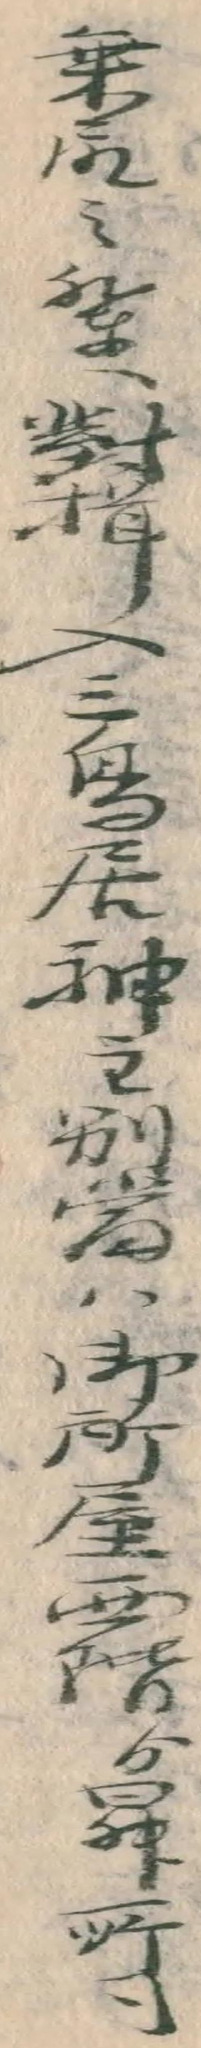乗尻之輩へ對輯入三鳥居神主別當ハ御所屋西階ゟ昇所司
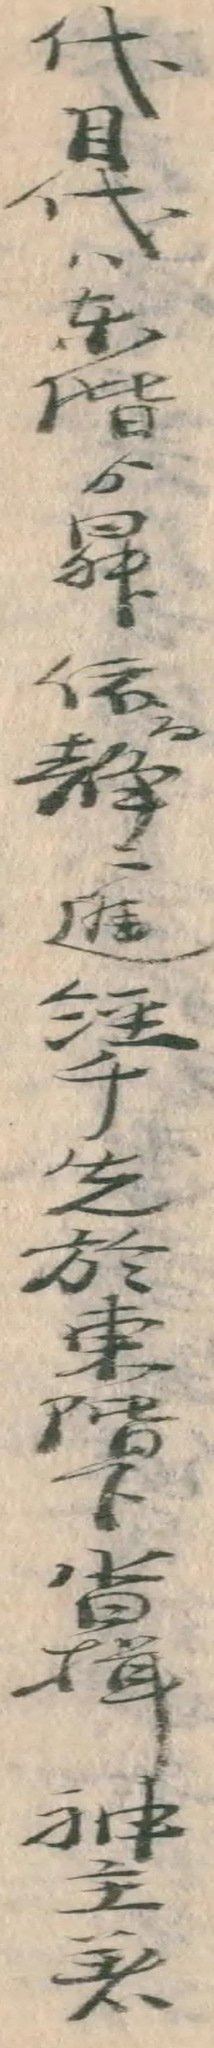代目代ハ東階ゟ昇依テ静ニ進経千先於東階下沓揖神主着
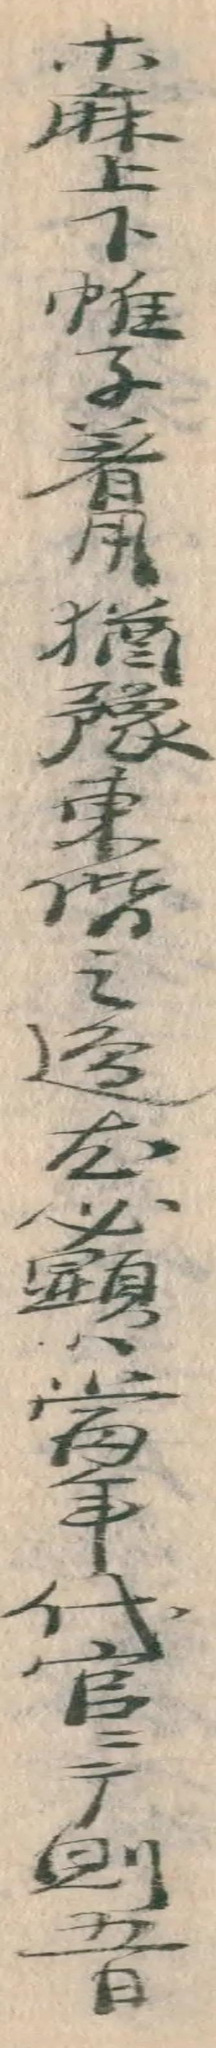等麻上下帷子着用猶予東階之邊尤必顕ハ當年代官ニテ則五日
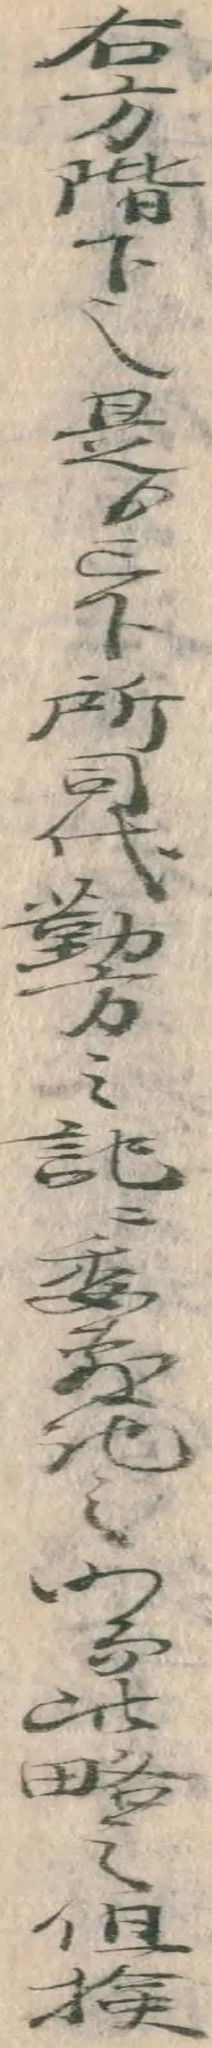右方階下也是ゟ已下所司代勤方之記ニ委敷記之仍而此略之但検
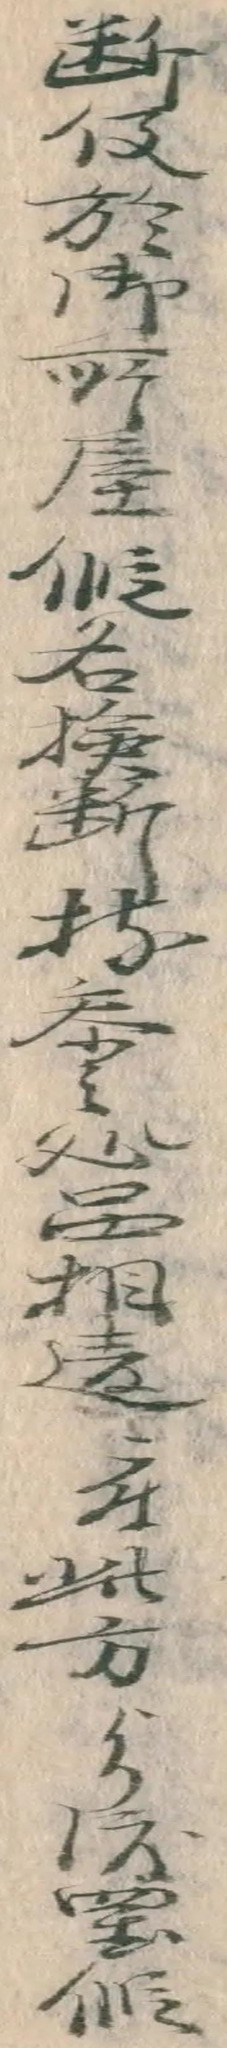断役於御所屋仮名検断持参之処品相違ニ付此方より渡置仮
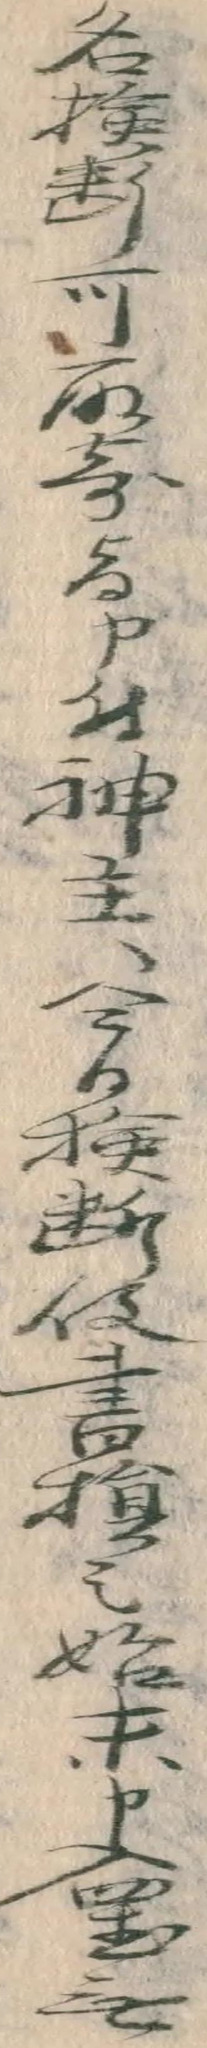名検断可取寄旨申付神主へ今日検断役書損之始末申入置無
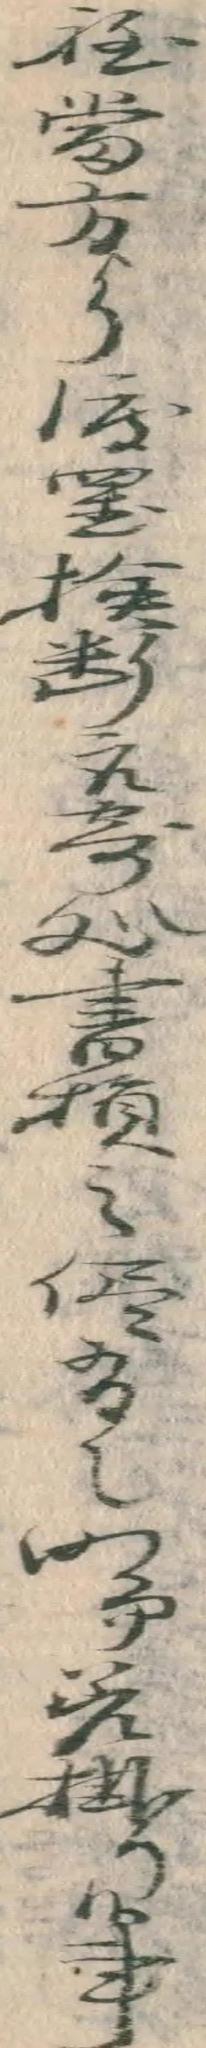程當方より渡置検断取寄処書損之侭有之仍而差掛り候事
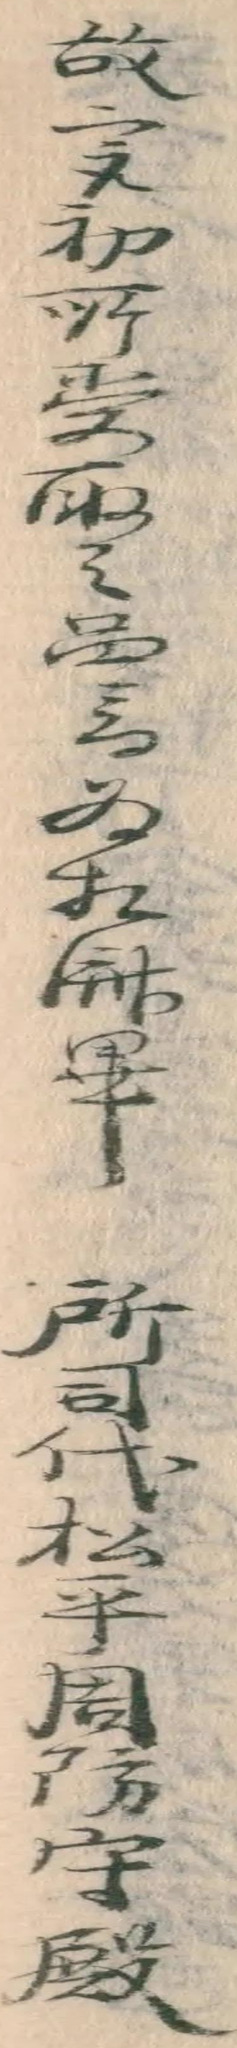故最初所受取之品ニ而為相済畢所司代松平周防守殿
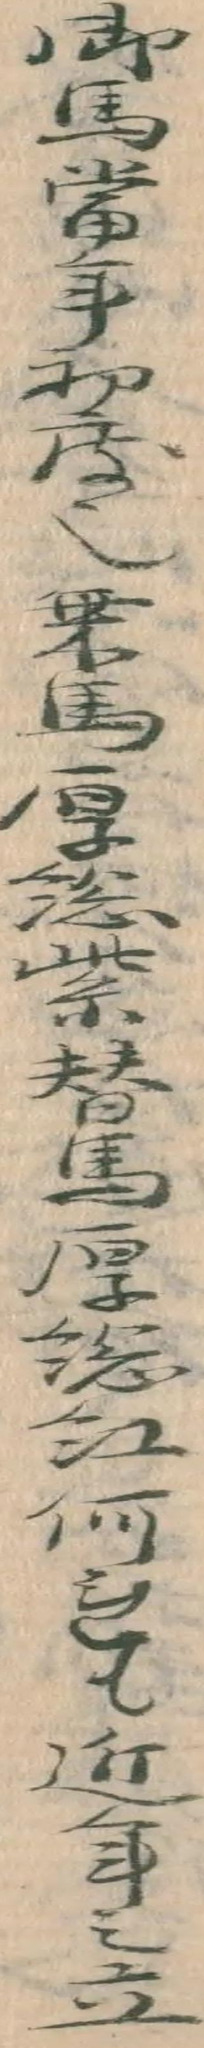御馬當年初度也乗馬厚総紫替馬厚総紅何れも近年之立
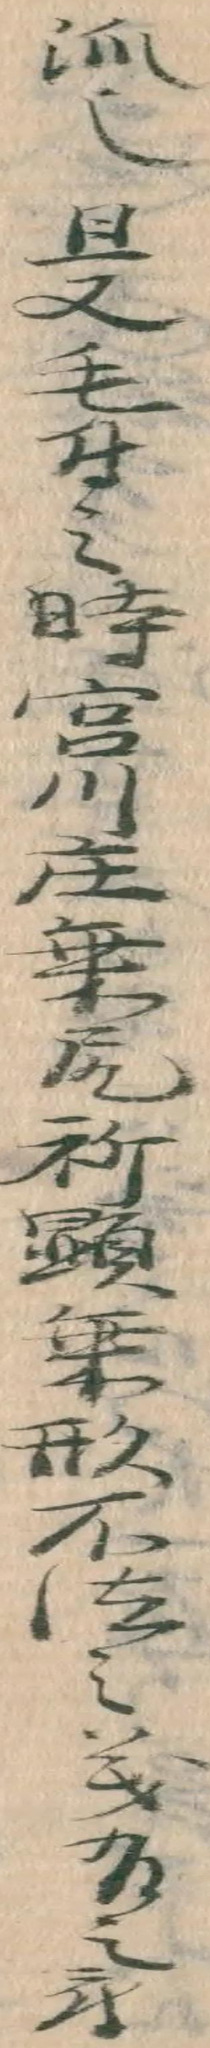派也且又毛付之時宮川庄乗尻祈顕乗形不法之義有之ニ付
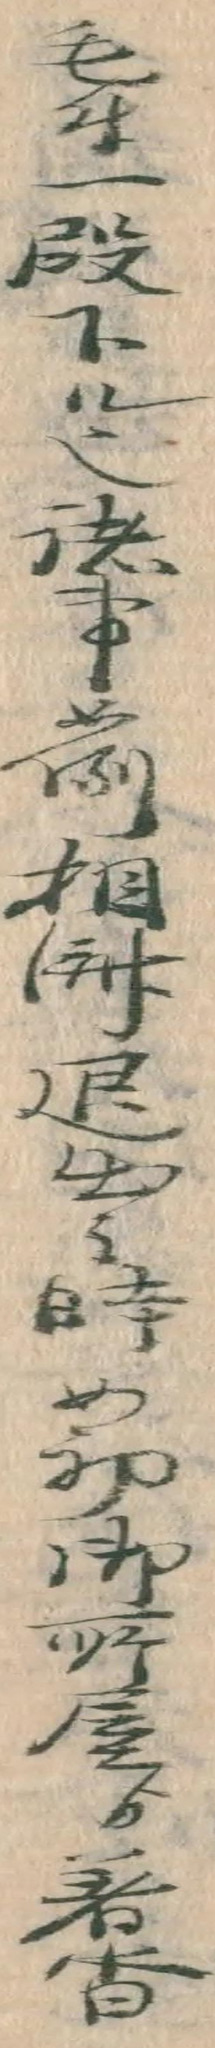毛付一段下ル也諸事如例相済退出之時如初御所屋ゟ着沓
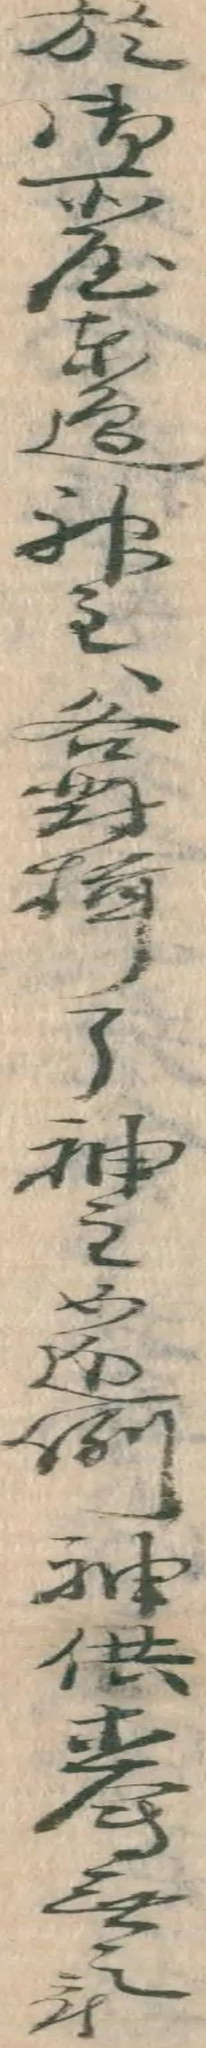於御所屋東邊神主ヘ各対揖了神主如近例神供直會無之ニ付
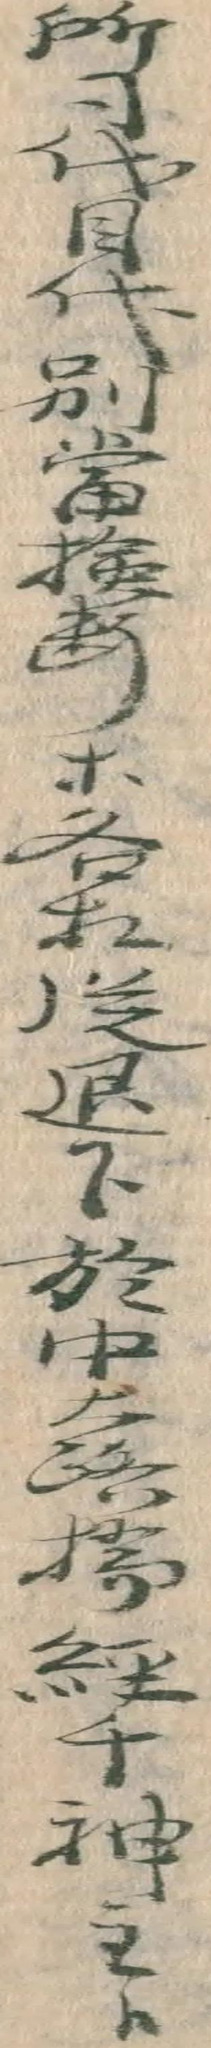所司代目代別當検断等各相従退下於中大路経千神主え
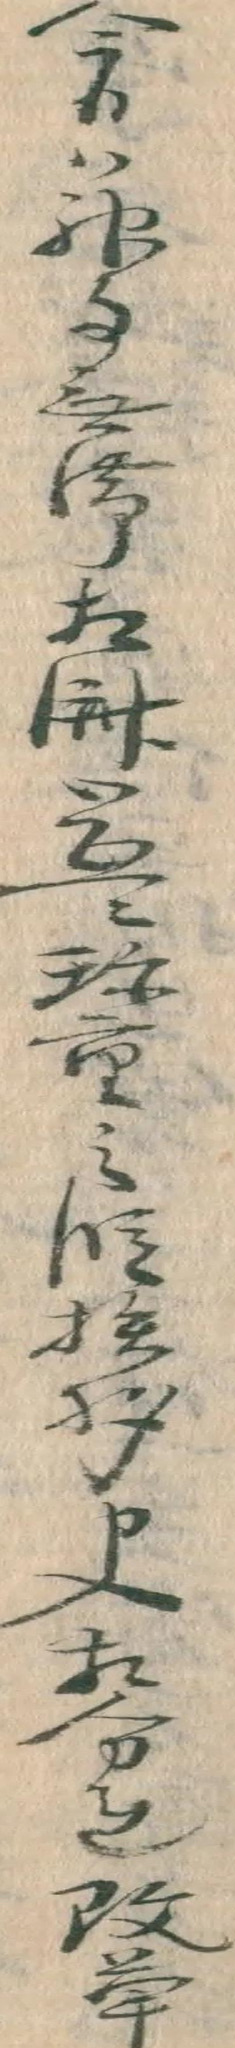今日ハ神事無滞相済御御互ニ珍重之段挨拶申入相分れ改革草
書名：賀茂社記録. 第65冊
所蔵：国立国会図書館 National Diet Library, JAPAN
